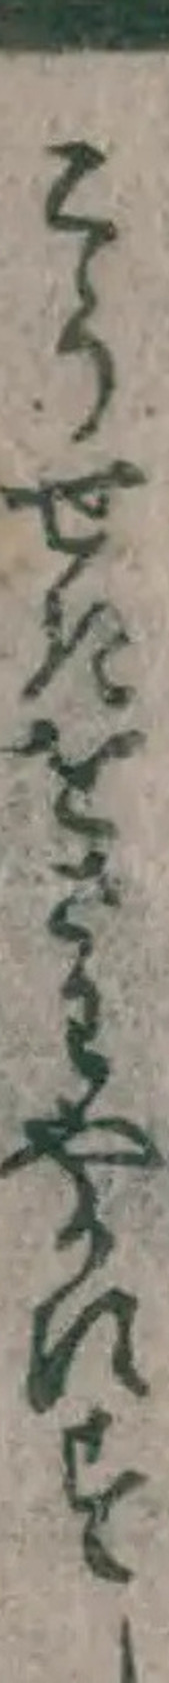こうせきをさわやかにす
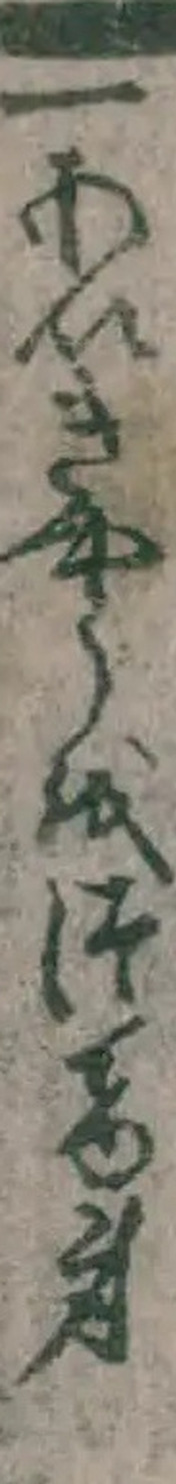一あいきやうをつけ身
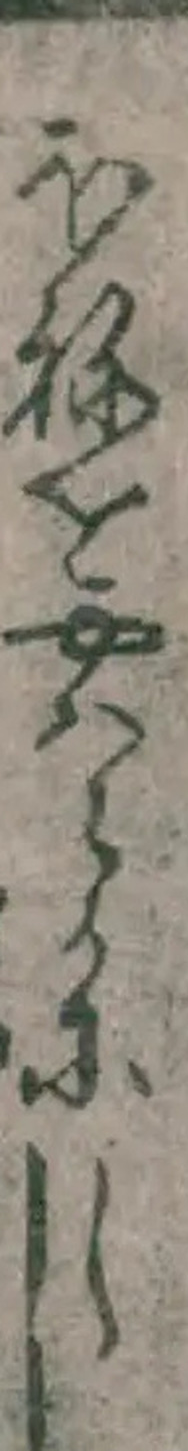ほねをやはらかにし
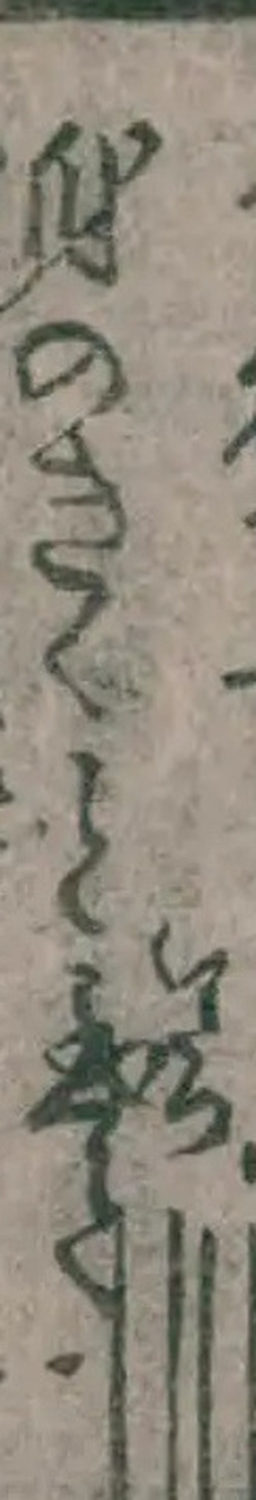身のきくこと至て
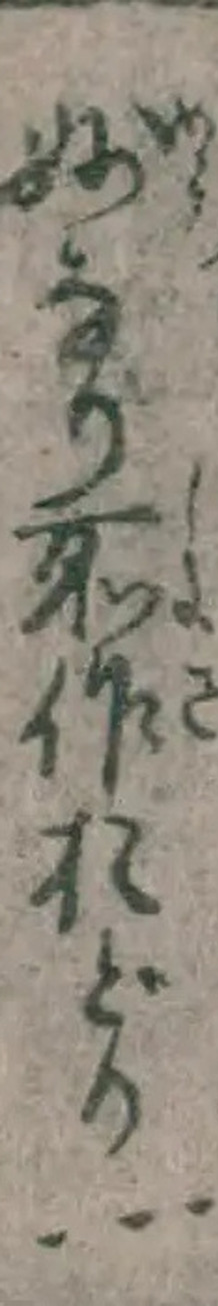妙なり所作おどり
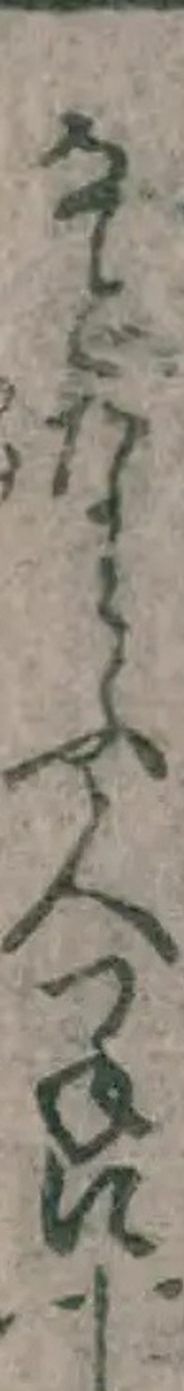などならふ人つねに
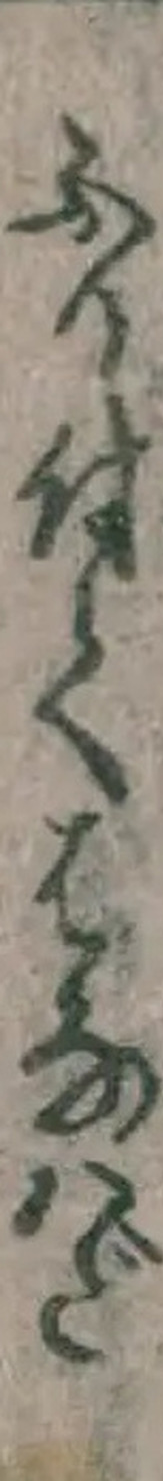ふり付てはなはだ
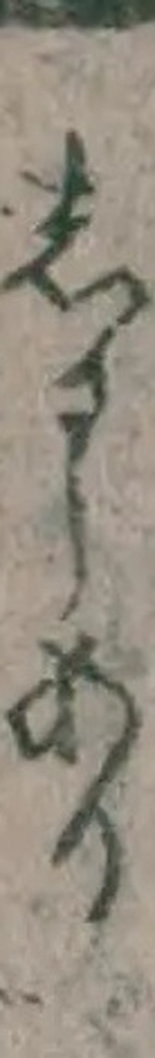しるしあり
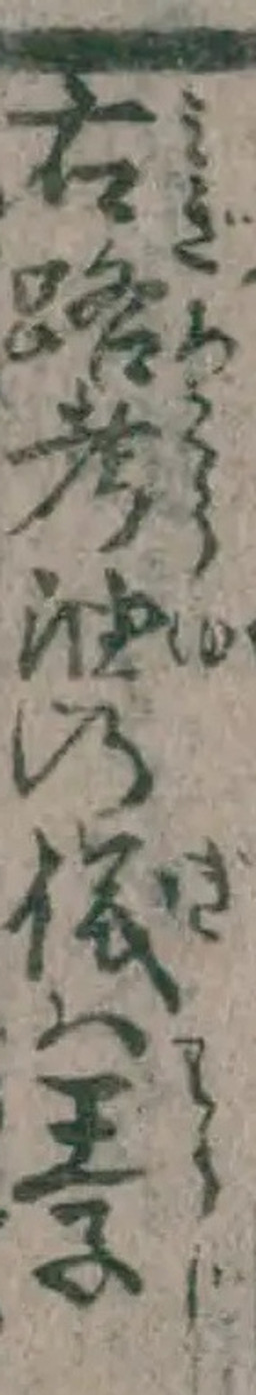右路考油の儀は王子
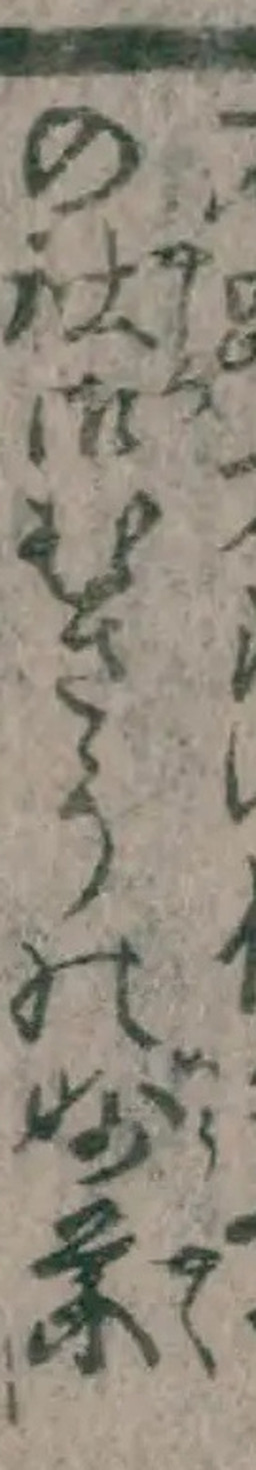の社御むさうの妙薬
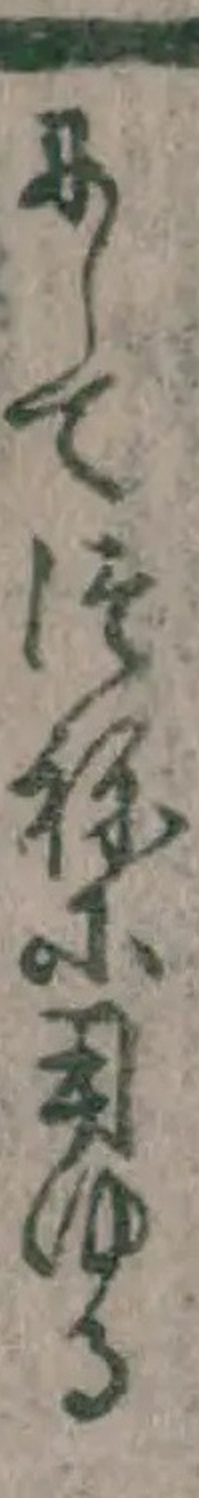にしてつねに用ゆる
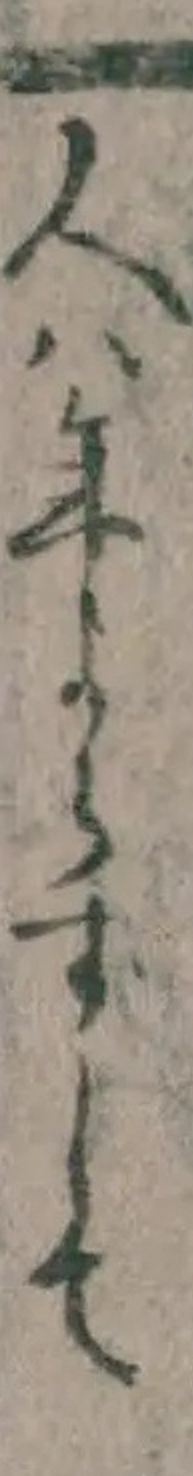人は年よらずして
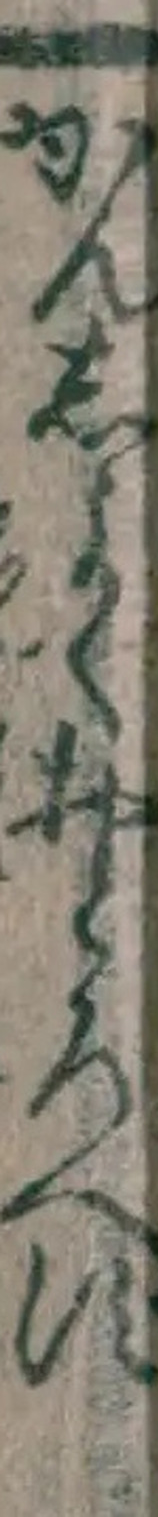かんしよくおとろへず
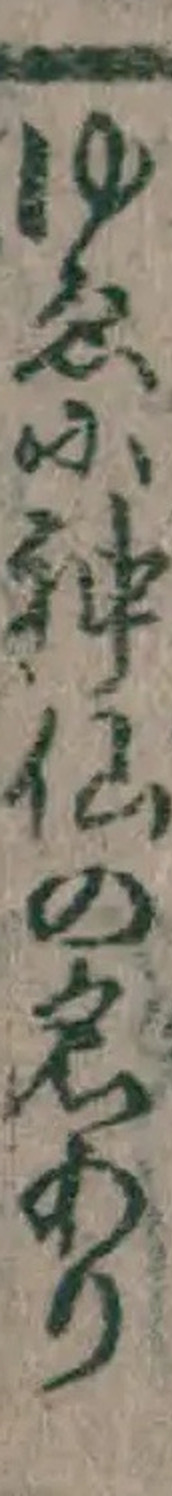ゆゑに神仙の名あり
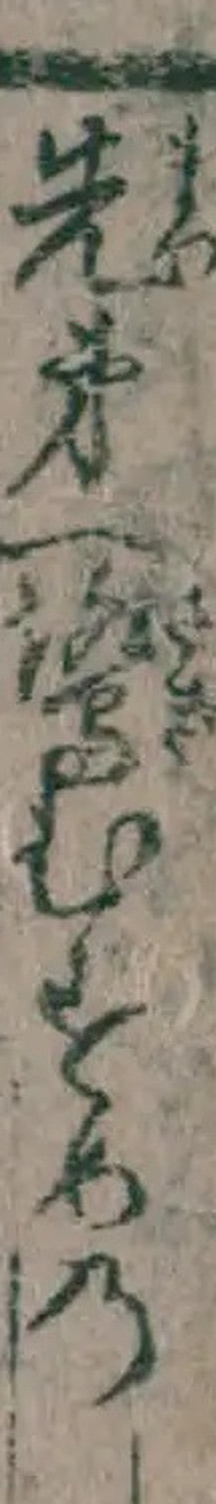先第一鷺むすめの
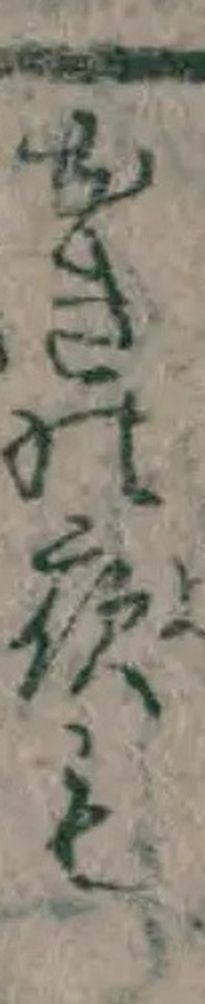ゆきの夜も
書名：視薬霞報条 3巻
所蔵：国立国会図書館 National Diet Library, JAPAN
